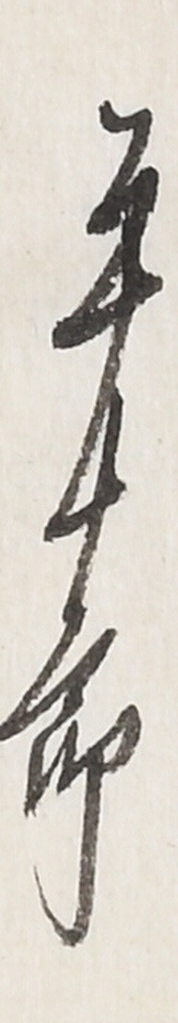平十郎
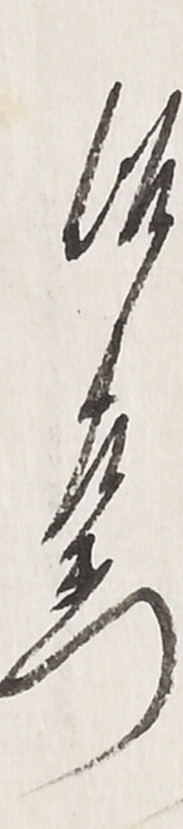彦左衛門
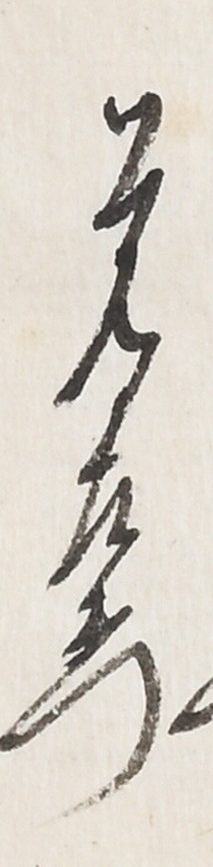覚左衛門
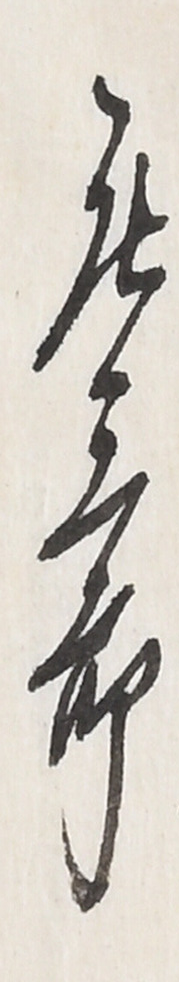庄三郎
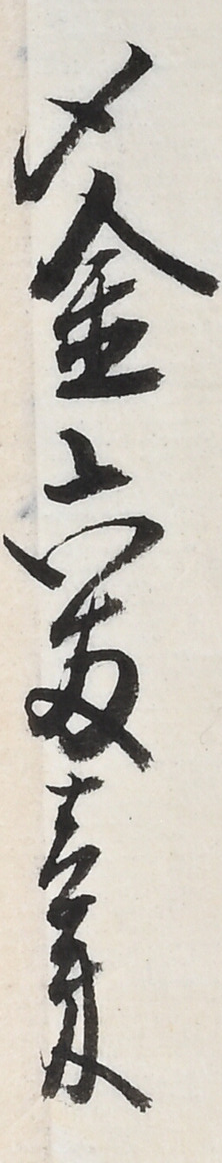〆金六両壱朱
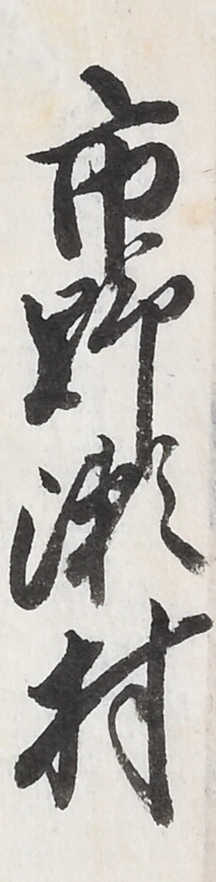市野瀬村
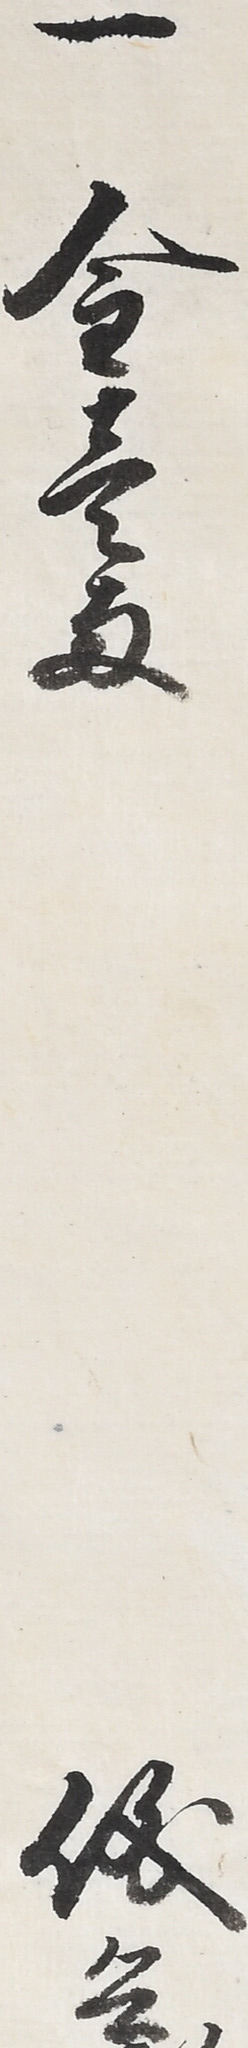一金壱両儀兵衛
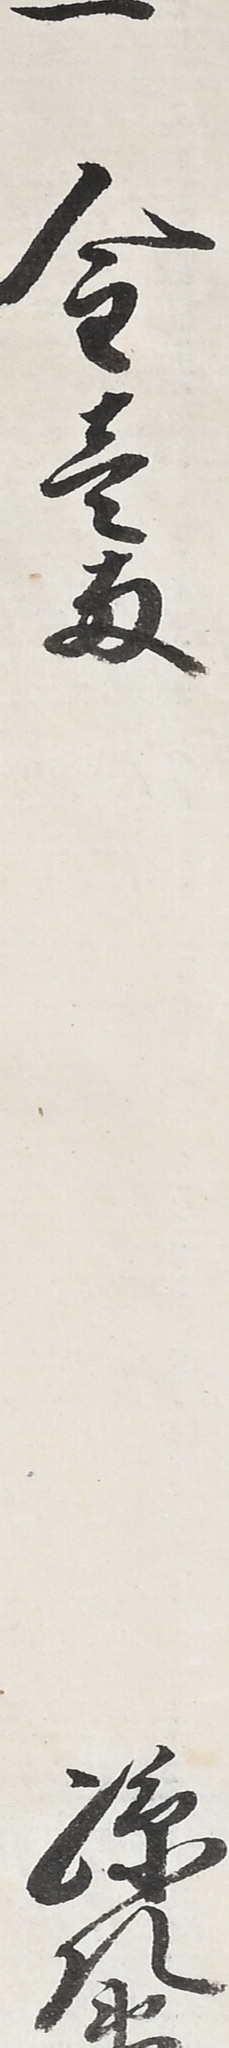一金壱両孫左衛門
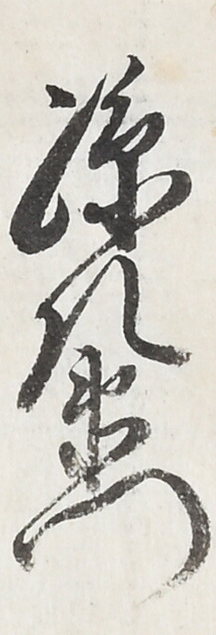彦左衛門
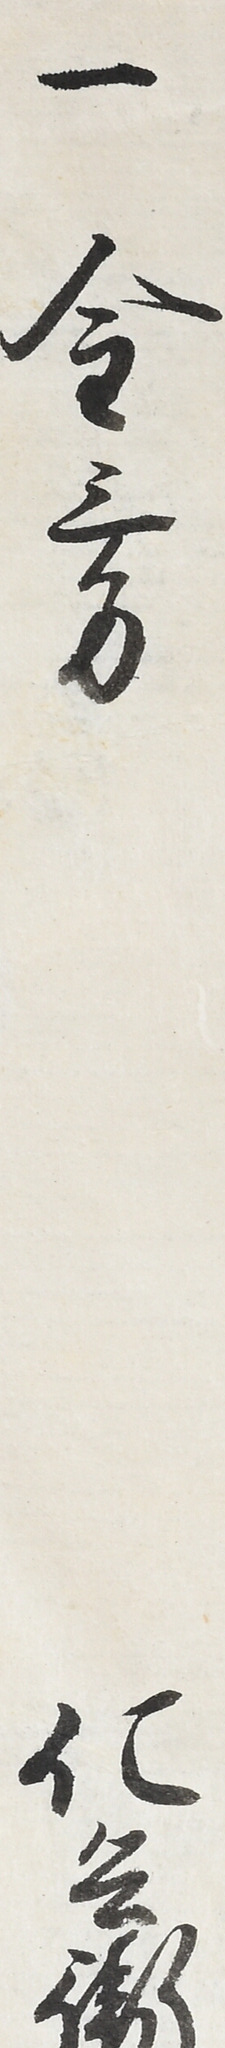一金三分仁兵衛

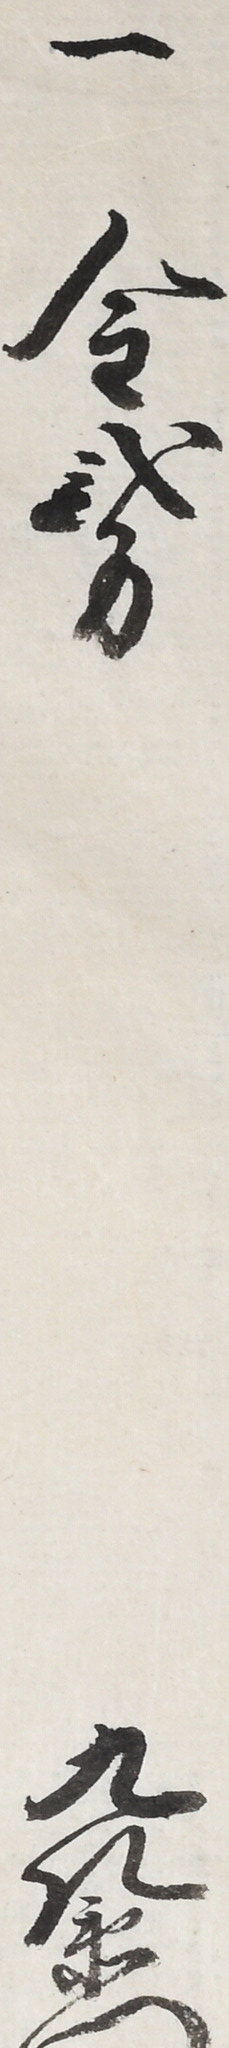一金弐分九左衛門
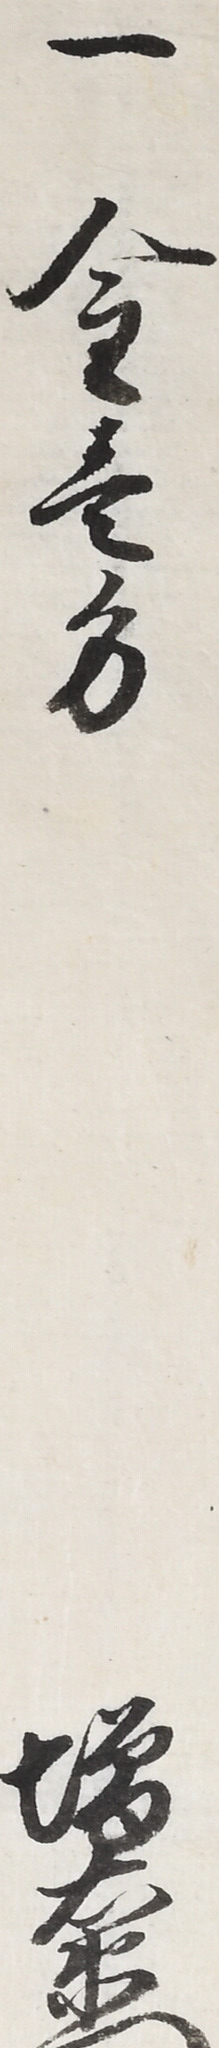一金壱分増右衛門
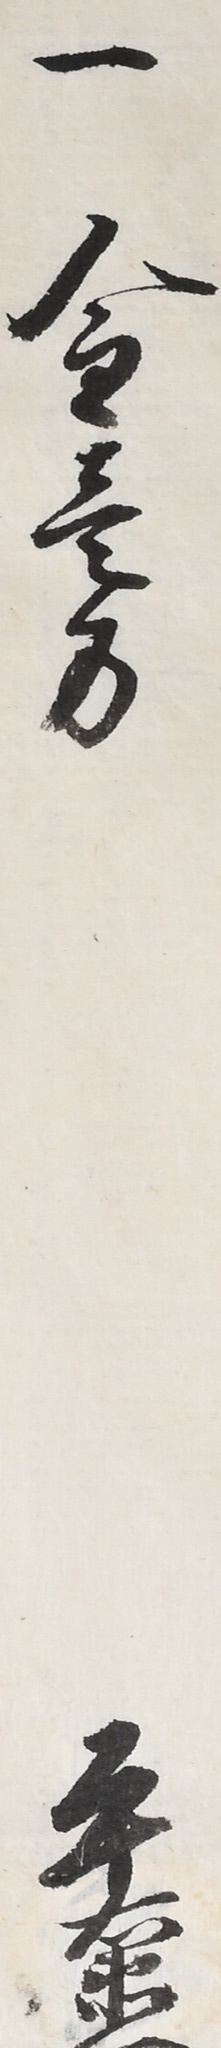一金壱分平右衛門
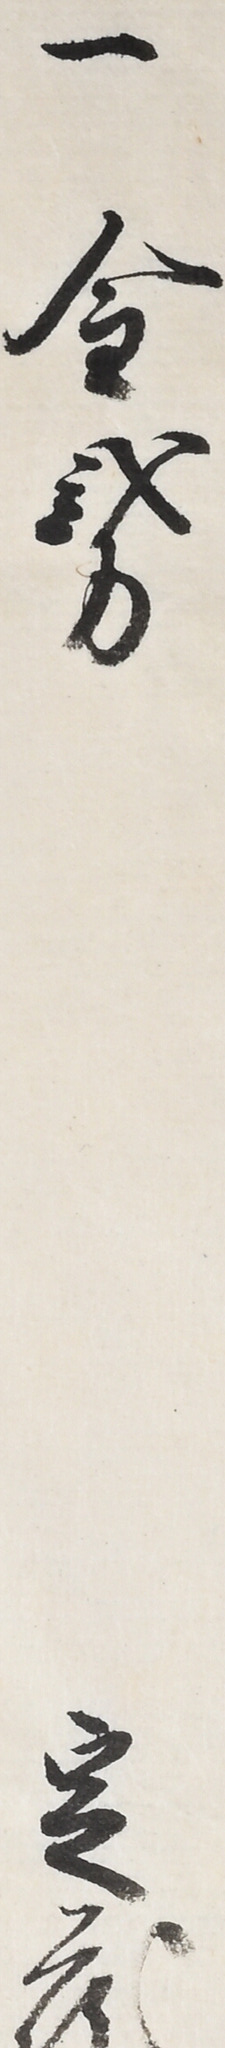一金弐分定蔵
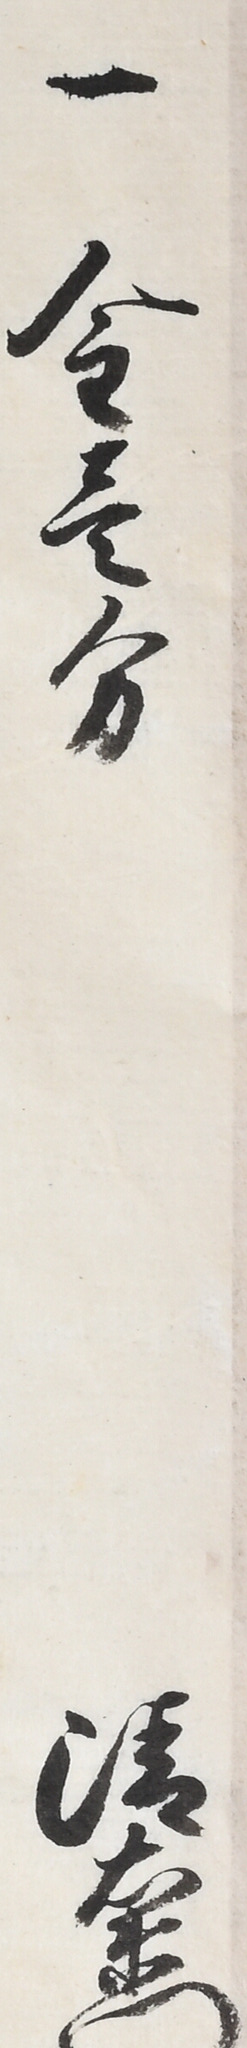一金壱分清右衛門
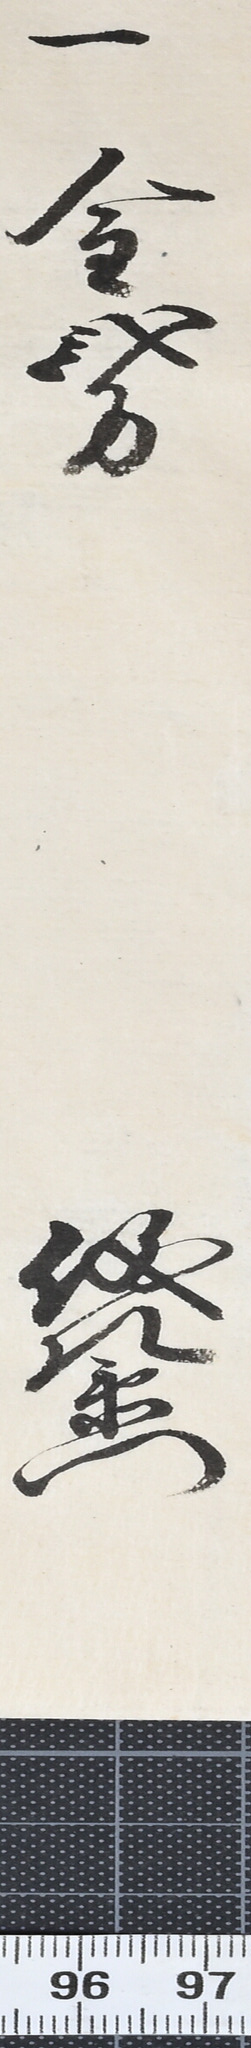一金弐分儀左衛門
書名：御拝地百五拾年御祝儀献上御目録名前
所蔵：伊那市立高遠町図書館・合同会社AMANE
